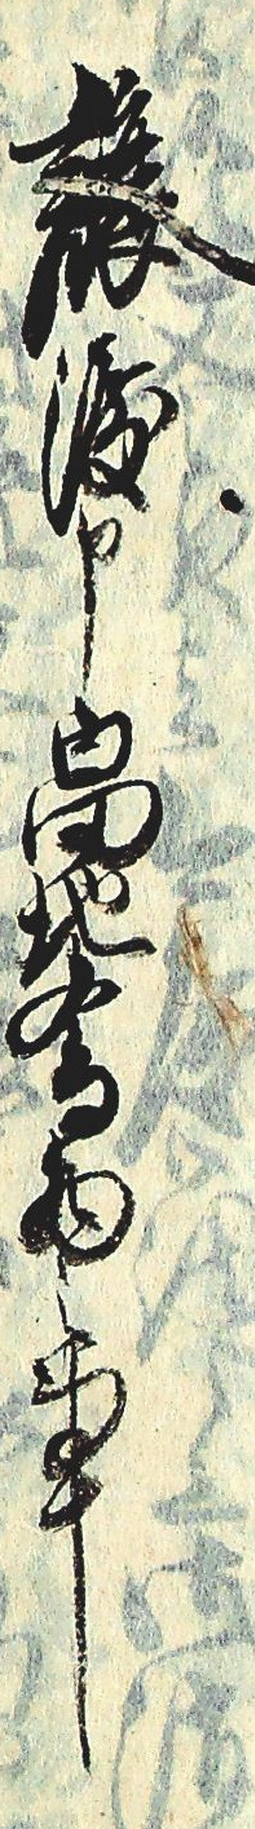譲渡申畠地書物之事
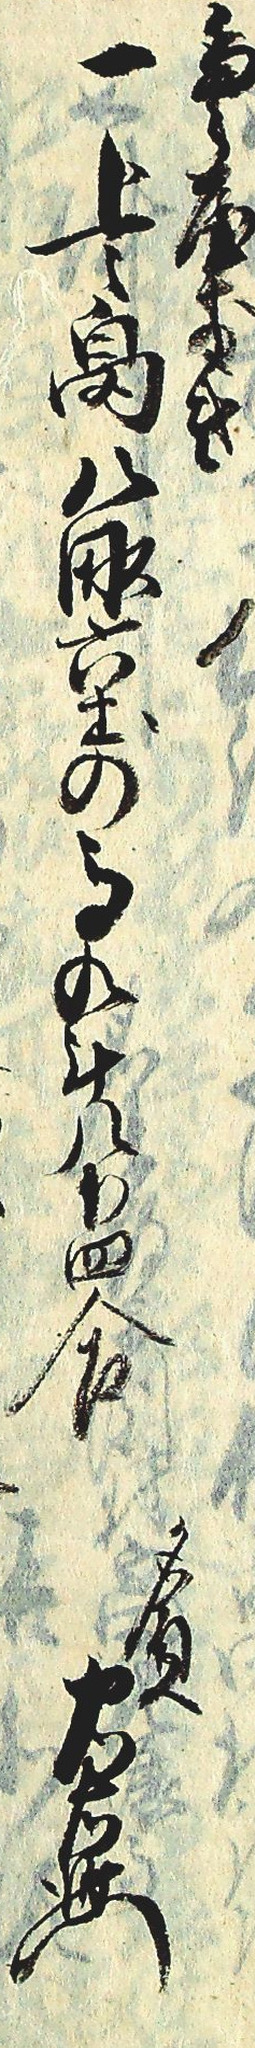一上々畠八畝六歩高九斗八升四合忠右衛門
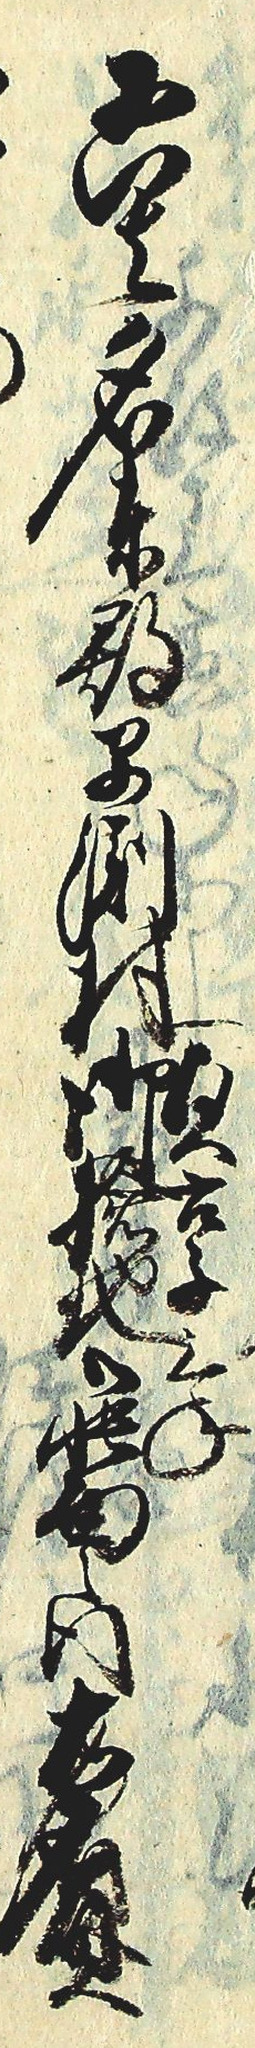右は名東郡早淵村貞享三年御検地御帳面之内右名負
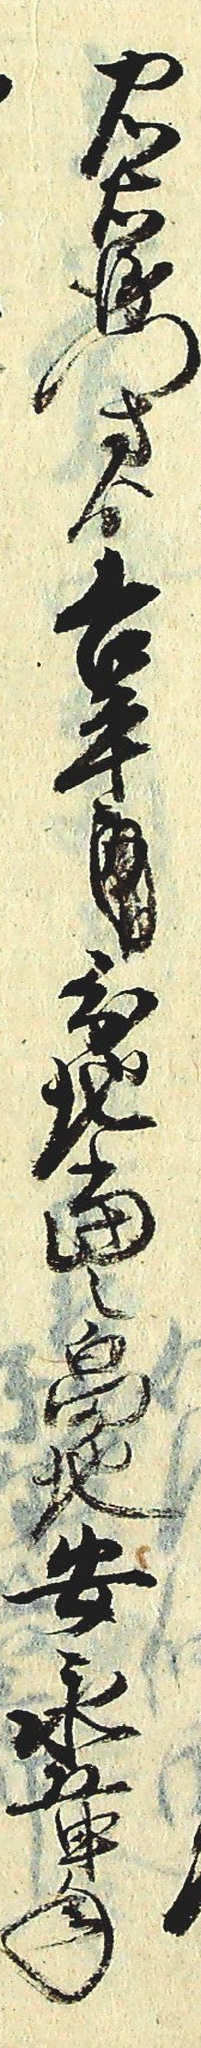忠右衛門方ゟ吉平分地当之畠地安永五申年
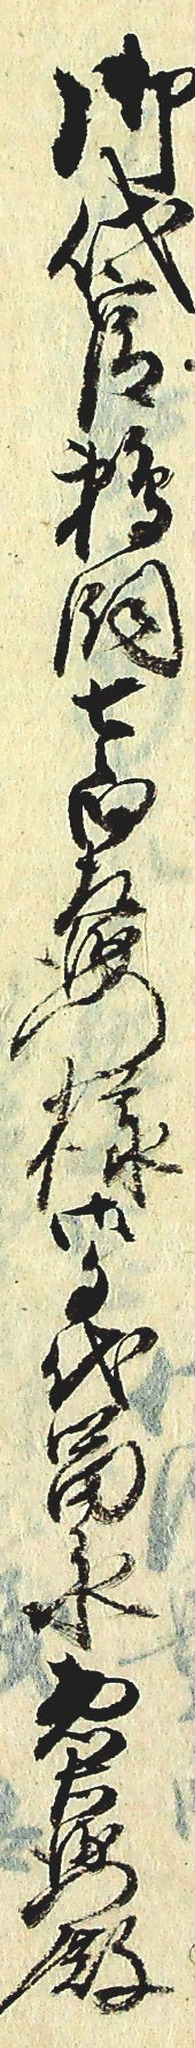御代官鵜飼七郎左衛門様御手代富永惣右衛門殿
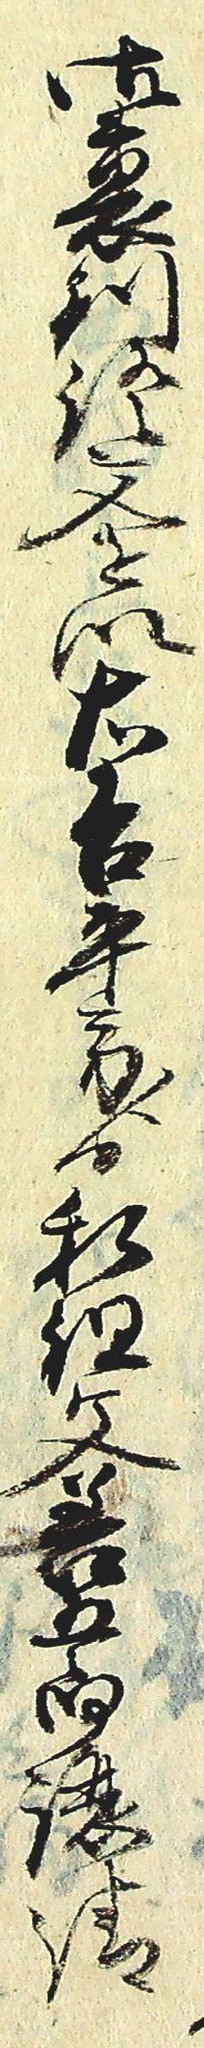御裏判証文を以右吉平方ゟ私祖父善五郎譲請
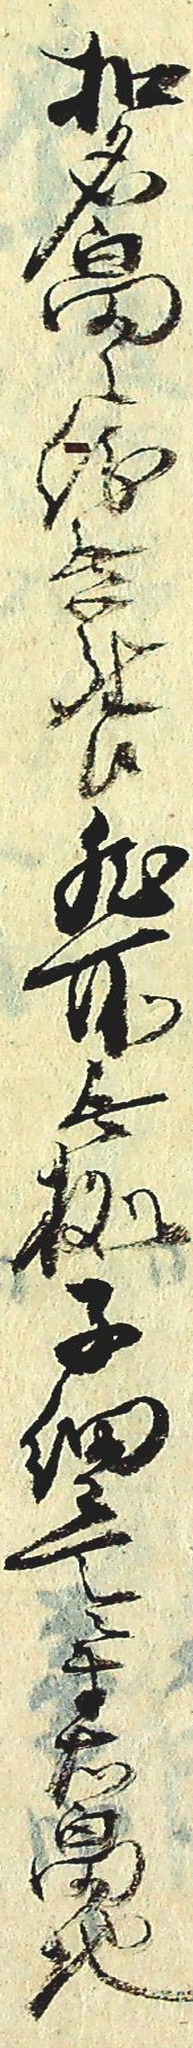扣名畠に紛無御座候然所無拠子細有之に付右畠地
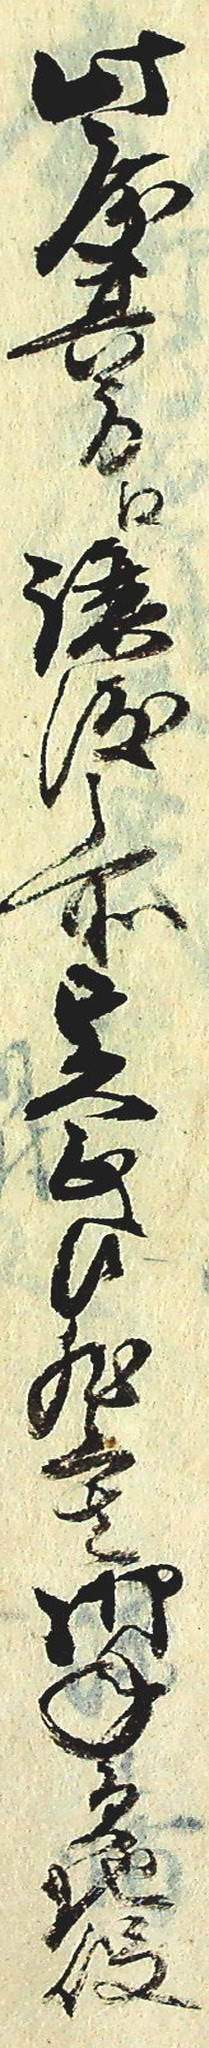此度其方え譲渡申所実正に候然上は御年貢地役
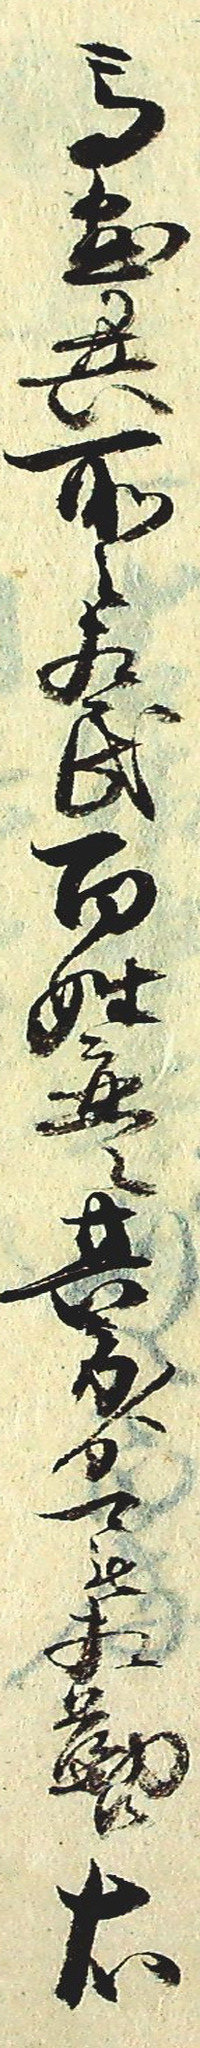高懸り共所之相民百姓並に其方ゟ可被相勤候右
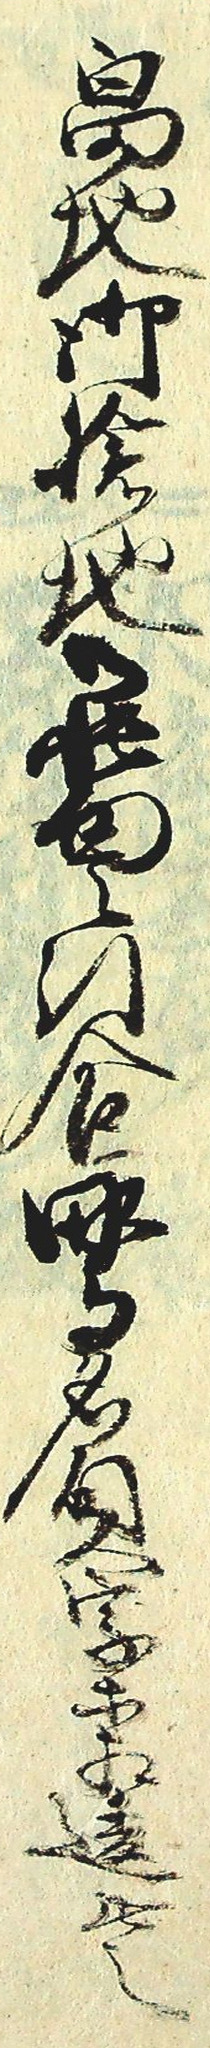畠地御検地御帳面に引合畝高名負字等相違無之
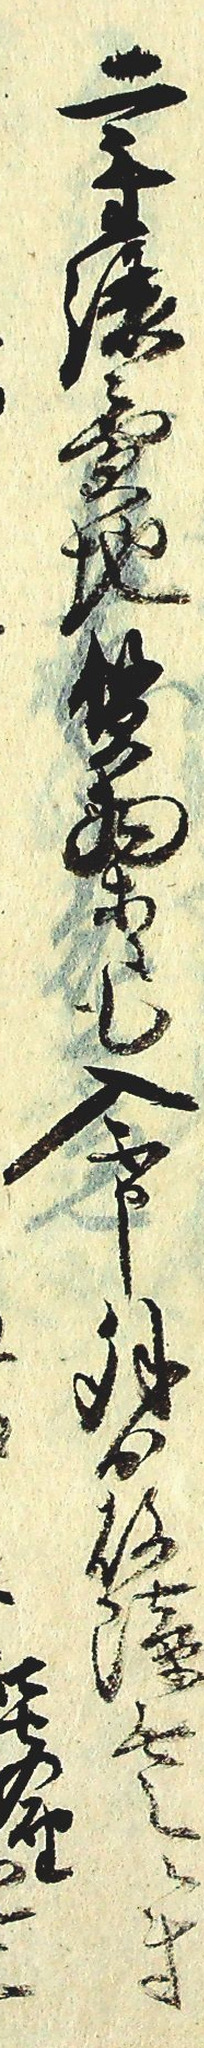二重譲売地質物等にも入不申外ゟ故障無之に付
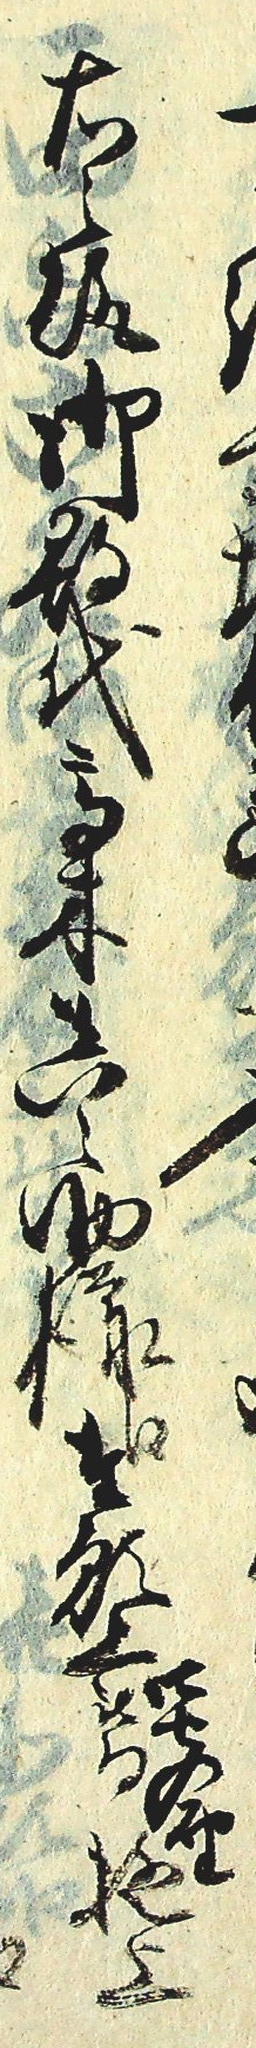右之趣御郡代高木真之助様え奉願上御聞届被為遊上
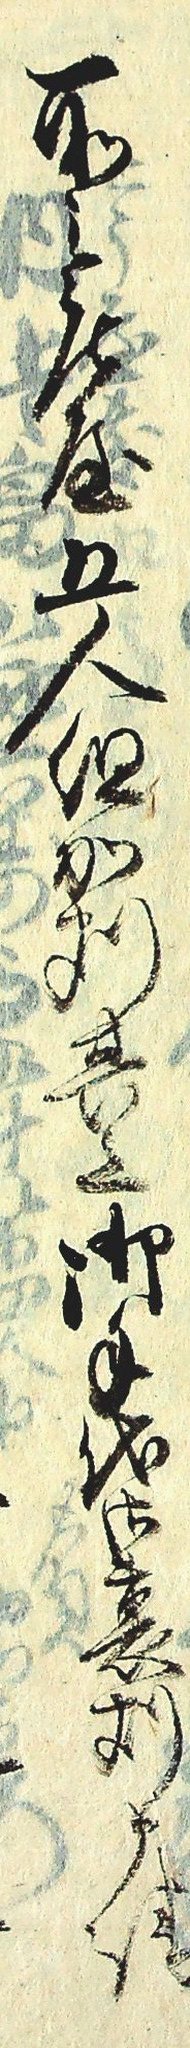所之庄屋五人組加判其上御手代御裏判申請
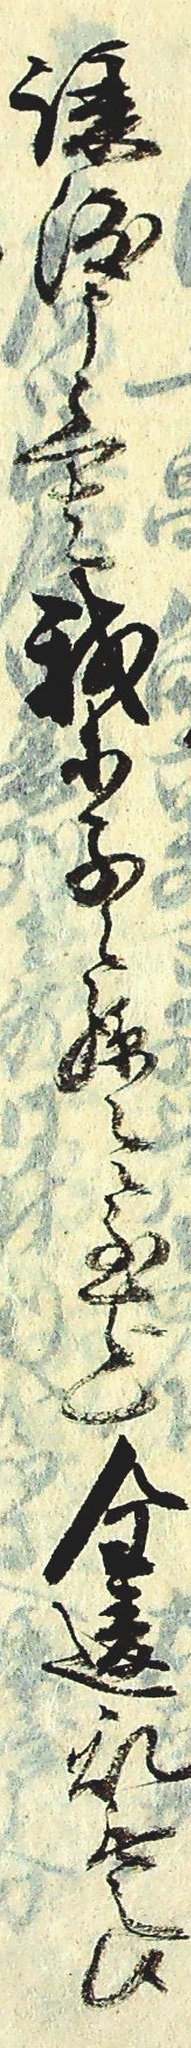譲渡申上は我等子々孫々に至迄全違乱無之候
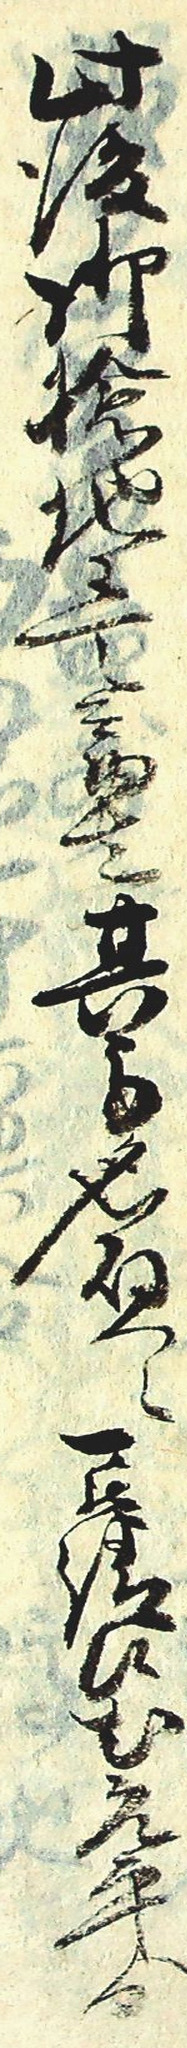此後御検地有之節は其方名負に可被請候尤吉平ゟ

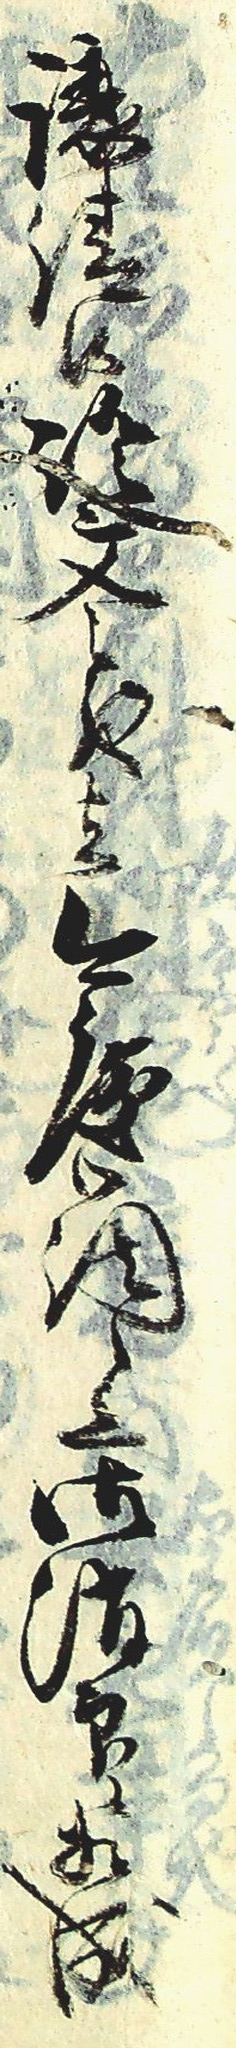譲請候証文之義は此度御調之上御消印に相成
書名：諸御願書控(弐番）
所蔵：鳴門教育大学 Naruto University of Education
